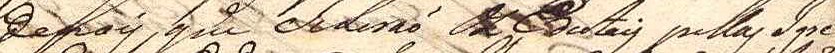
depois que Se Leraõ oz Editais pellas Igre
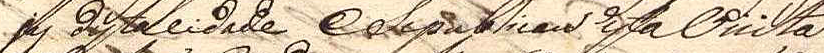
jas desta cidade e Se publicou esta Uizita
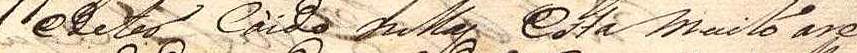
e de ter Caido nellas esta muito are
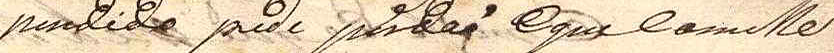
pendido pede perdaõ E que com elle
